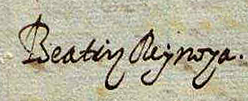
Beatriz Reynoza.
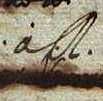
a R.
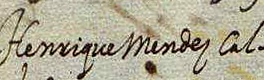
Henrique Mendez Cal
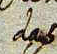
das
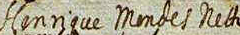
Henrique Mendes netto
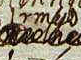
Irmão
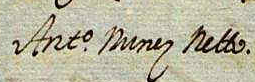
Ant.o nunez netto.
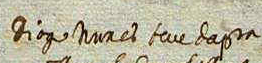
Diogo nunes teue da pra
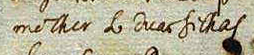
molher so duas filhas
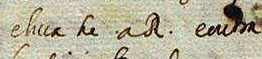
e hua he a R. e outra
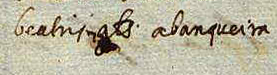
beatris gl̄s. a banqueira
